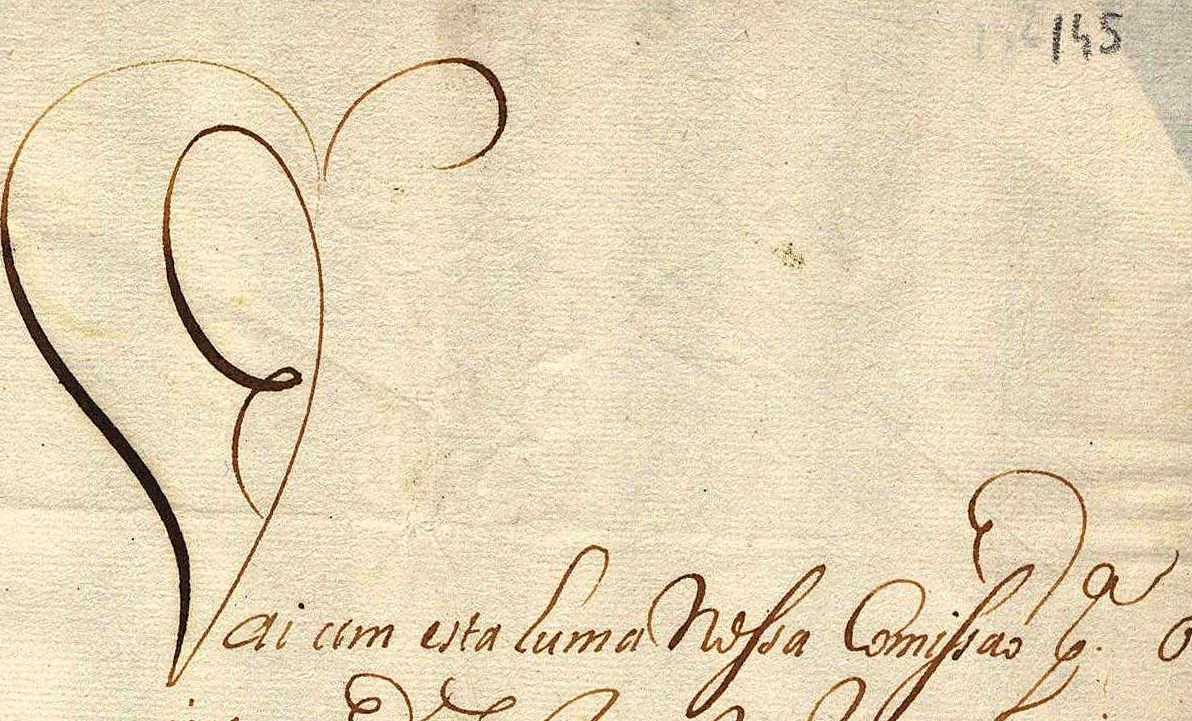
vai com esta huma nossa Comissão p.a o
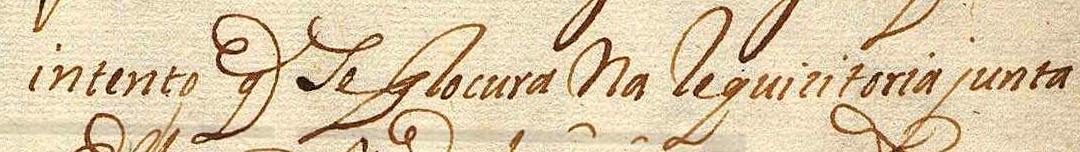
intento q̄ se procura na Requizitoria junta
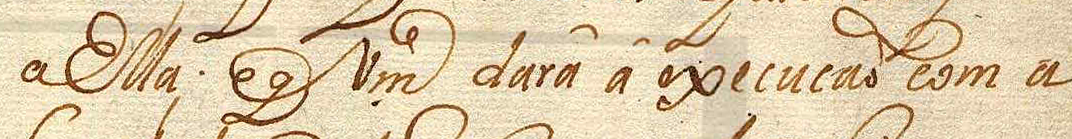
a Ela. e q̄ Vme dará á execuçaõ com a
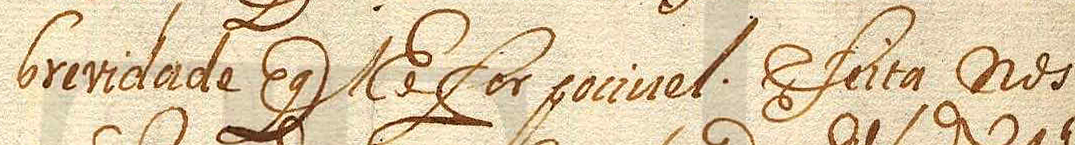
brevidade q̄ lhe for pociuel. E feita nos
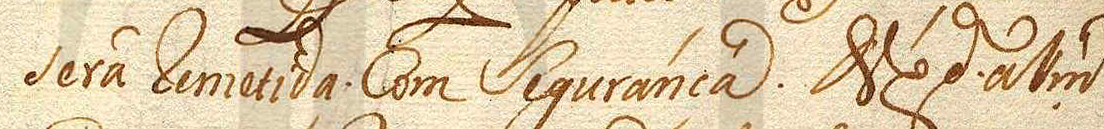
será Remetida Com Segurança. Ds g.de a Vm̄
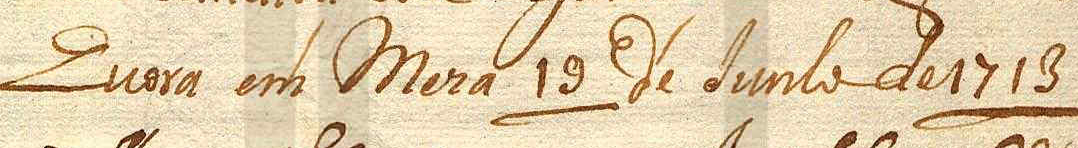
Euora em Meza 19 de Iunho de 1713
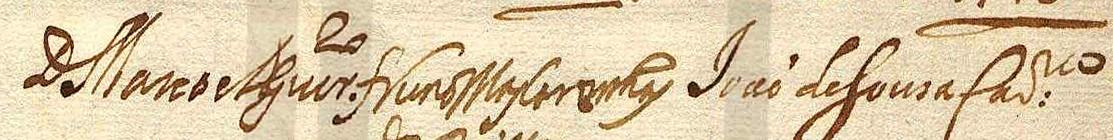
de Manoel Guer.o Nuno MasCarnhas Ioaõ de sousa Car.uo
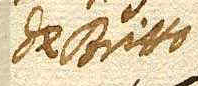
de Britto
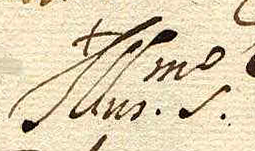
Illus.mo s.
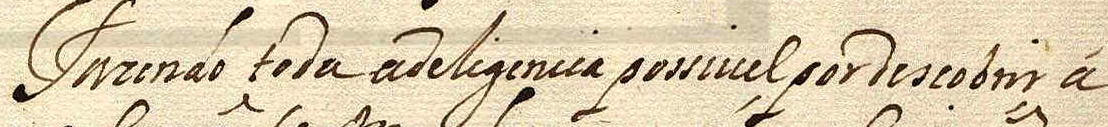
Fazendo toda a deligencia possiuel por descobrir a
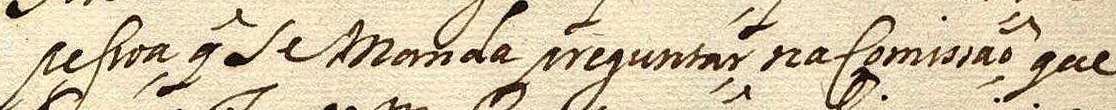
pessoa q̄ se manda preguntar na Comissaõ, que
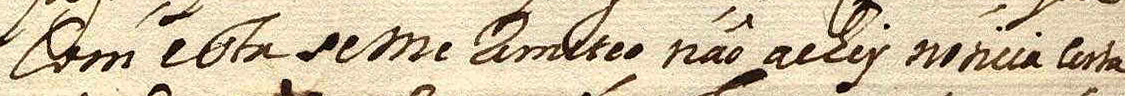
Com esta se me Remeteo, naõ achey noticia certa
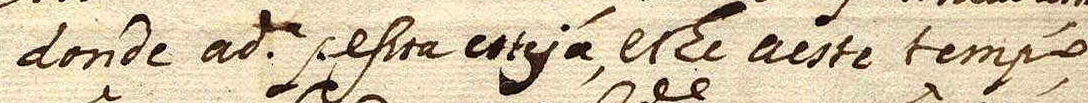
donde a d.a pessoa esteja, e the a este tempo
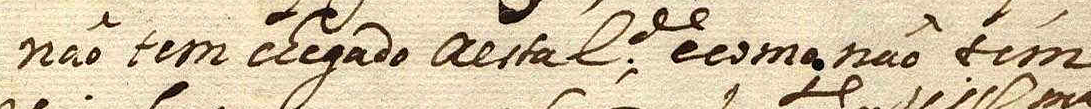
naõ tem chegado a esta C.de e como naõ tem
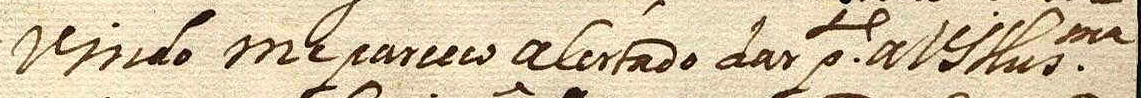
vindo me pareceo aCertado dar p.te a VSIllus.ma
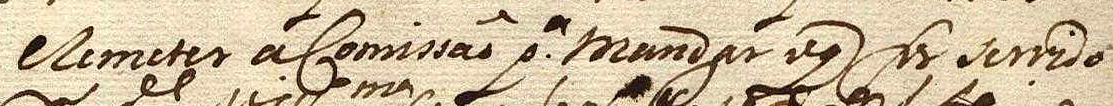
e Remeter a Comissaõ p.a mandar o q̄ for servido
